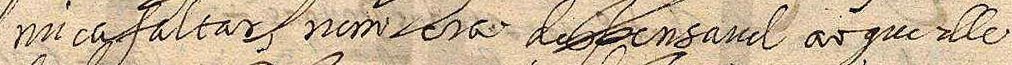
nūca faltar, nem era despensauel ao que elle
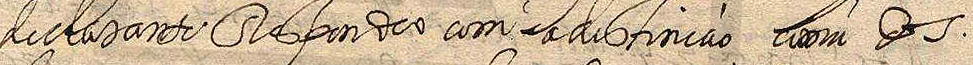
declarante Respondeo com a destinção comū dos
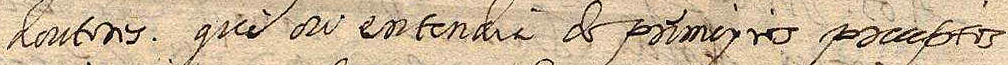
doutores. que ou entendia do primeyros preceptos
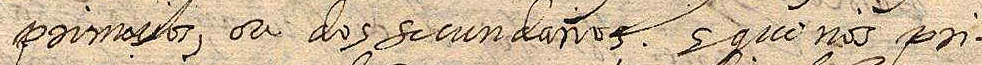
primeuos, ou dos secundarios. E que nos pri
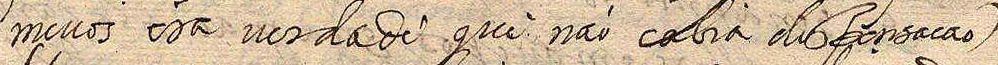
meuos era uerdade que naõ cabia dispensacaõ
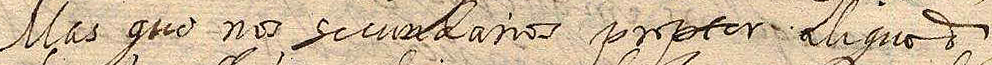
Mas que nos secundarios propter aliquod
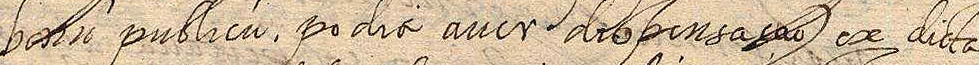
bonū publicū. podia auer dispensacaõ ex dicta
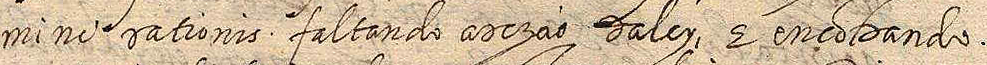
mini rationis. faltando a rezão da ley, E encōtrando
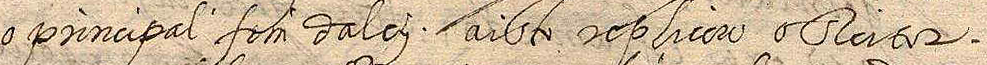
o principal fim da ley. a isto replicou o Reitor
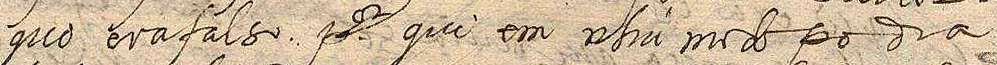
que era falso. p.or qui em nhū modo podia
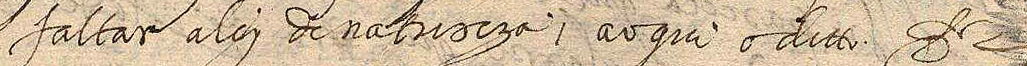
faltar a ley de natureza / ao qui o ditto Dtor
